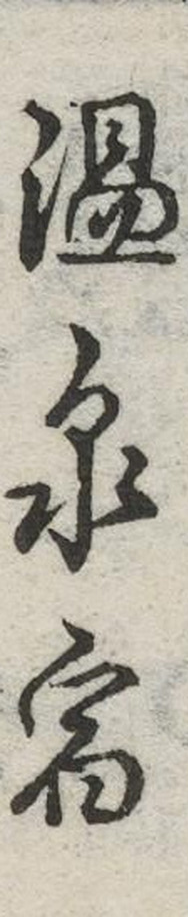温泉宿
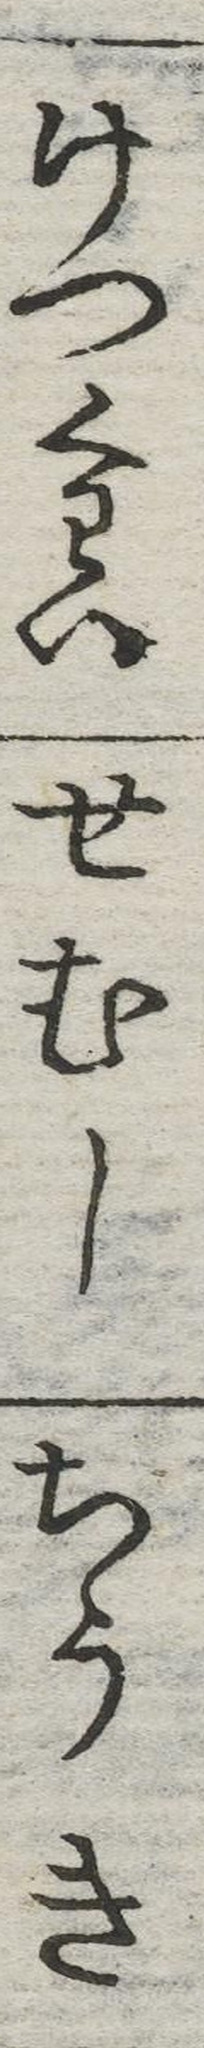けつくわいせむしちうき
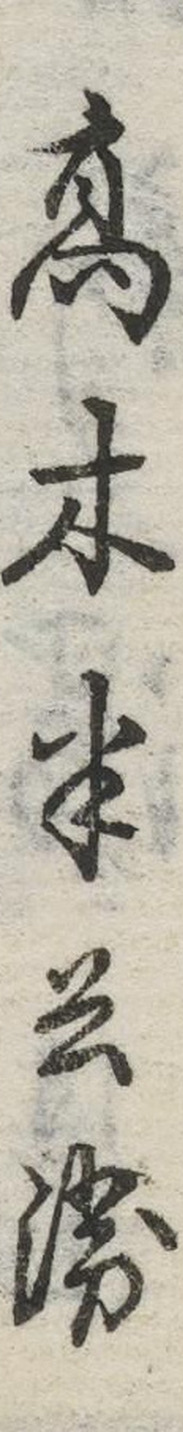高木半兵衛
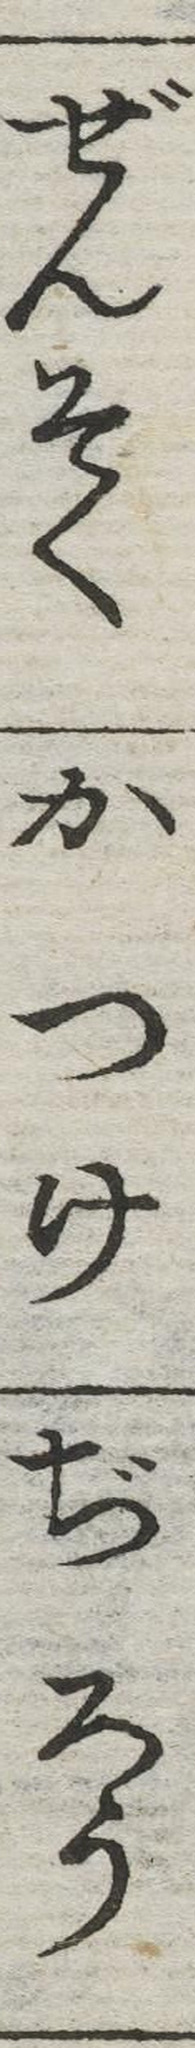ぜんそくかつけぢろう
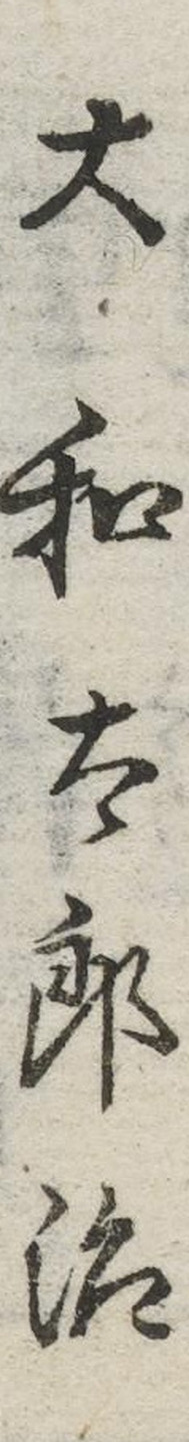大和太郎治
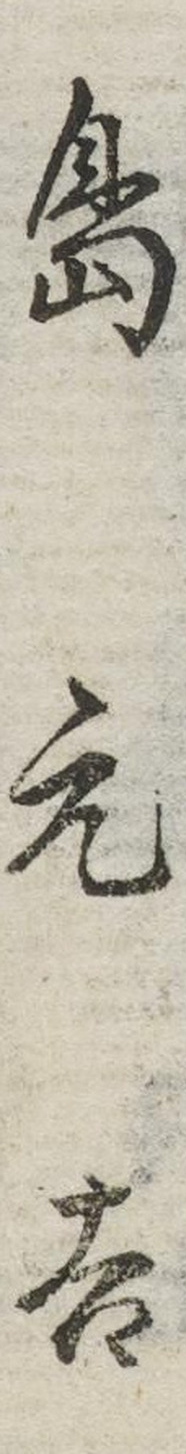島元吉
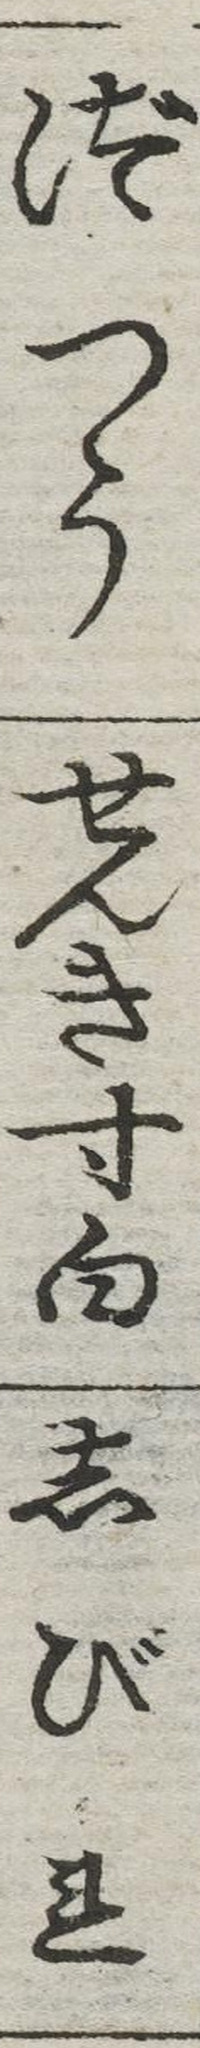づつうせんき寸白しびれ
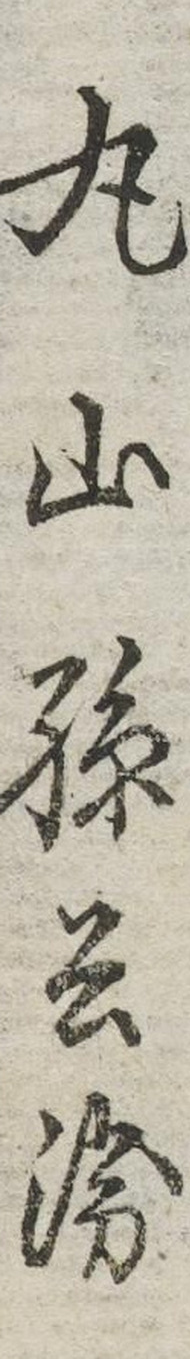丸山孫兵衛
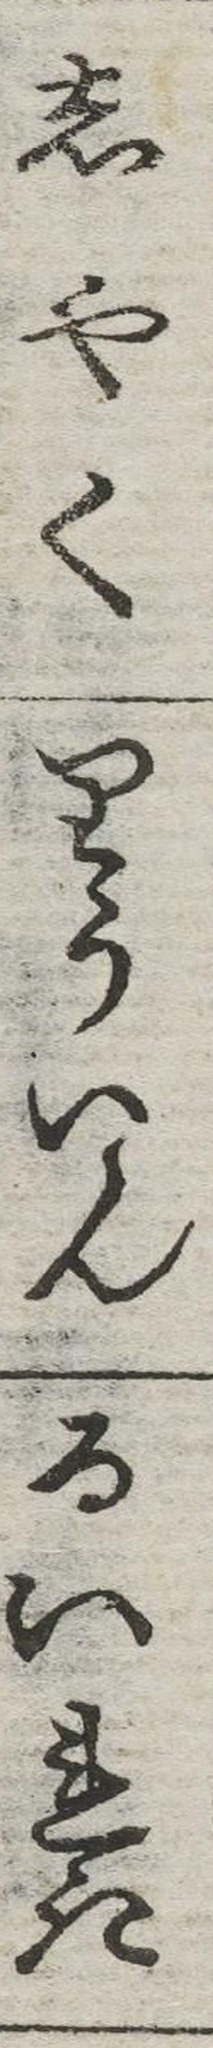しやくりういんるいれき
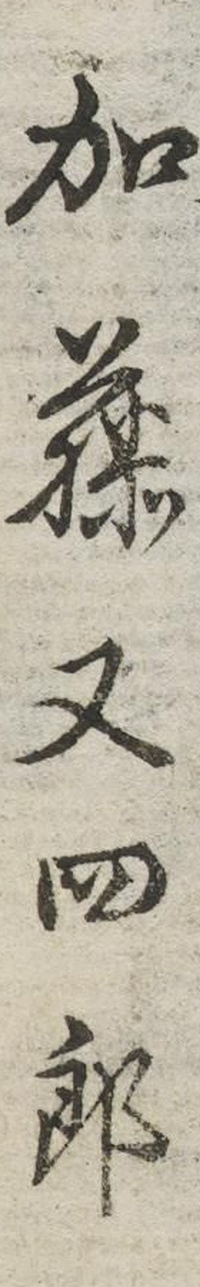加藤又四郎
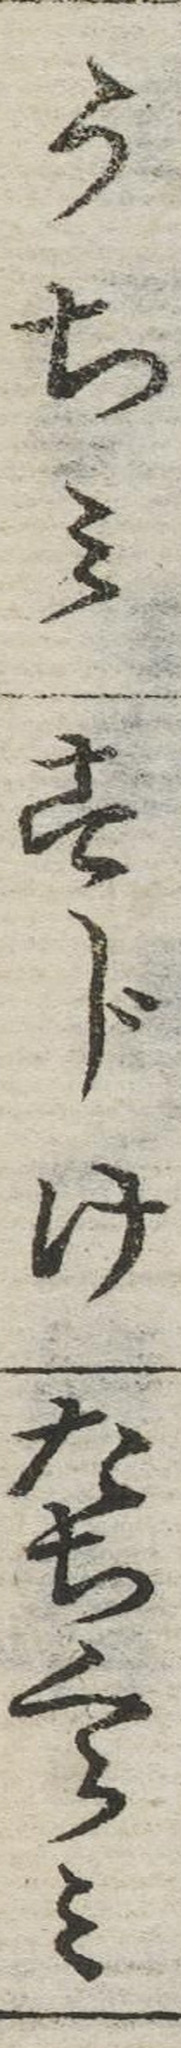うちみすじけたちくらみ

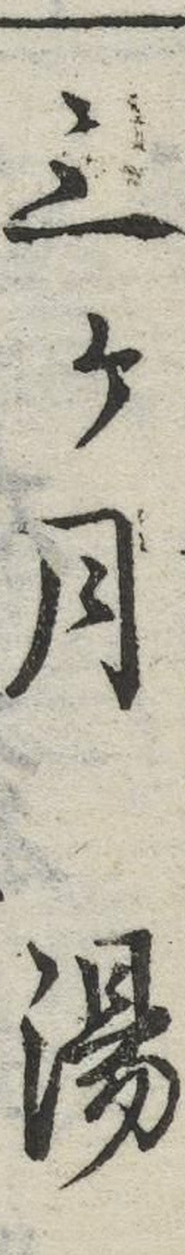三ヶ月湯
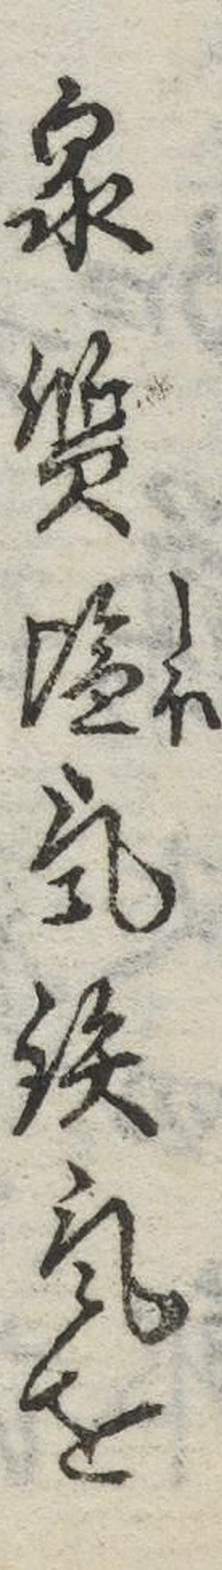泉質塩気鉄気を
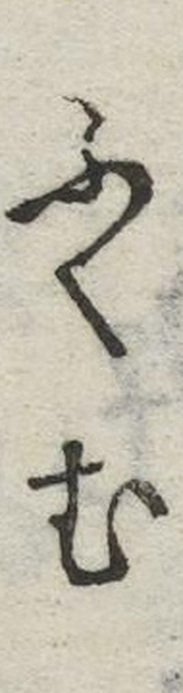ふくむ
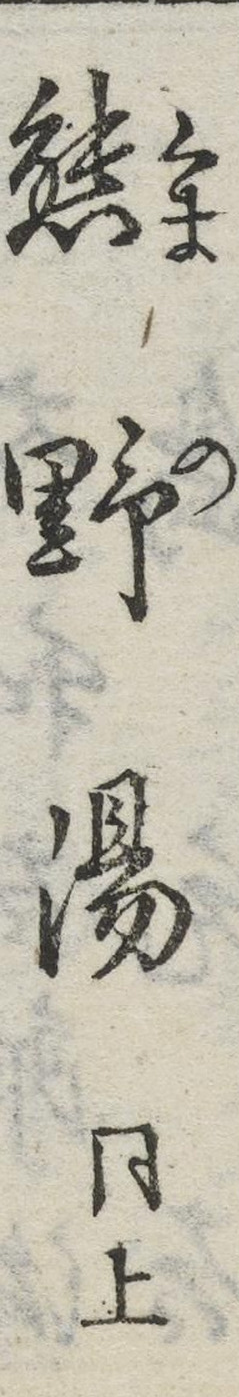熊野湯同上
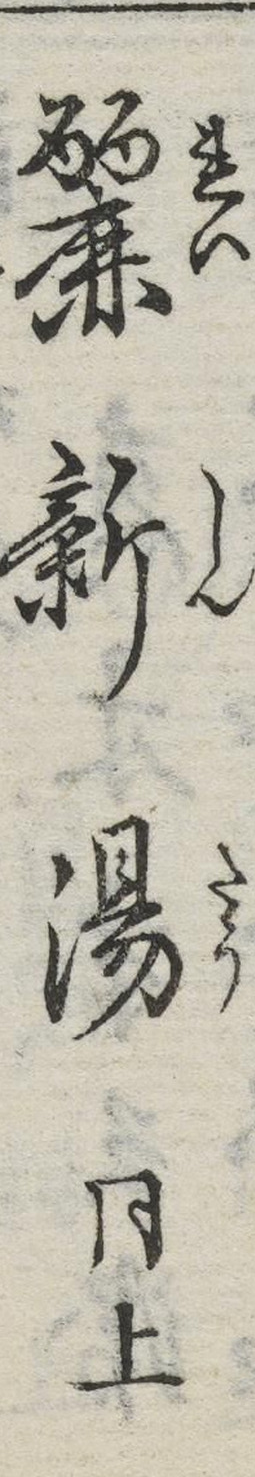麗新湯同上
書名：諸國温泉遊覽記　全
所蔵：東京大学地震研究所図書室 Earthquake Research Institute Library, The University of Tokyo, JAPAN
